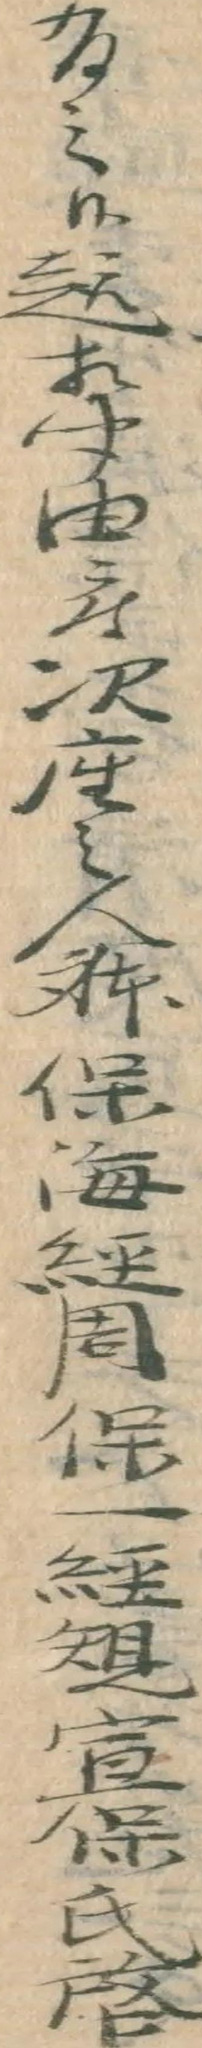有之候趣相聞由ニ付次座之人躰保海経周保一経規宣保氏啓

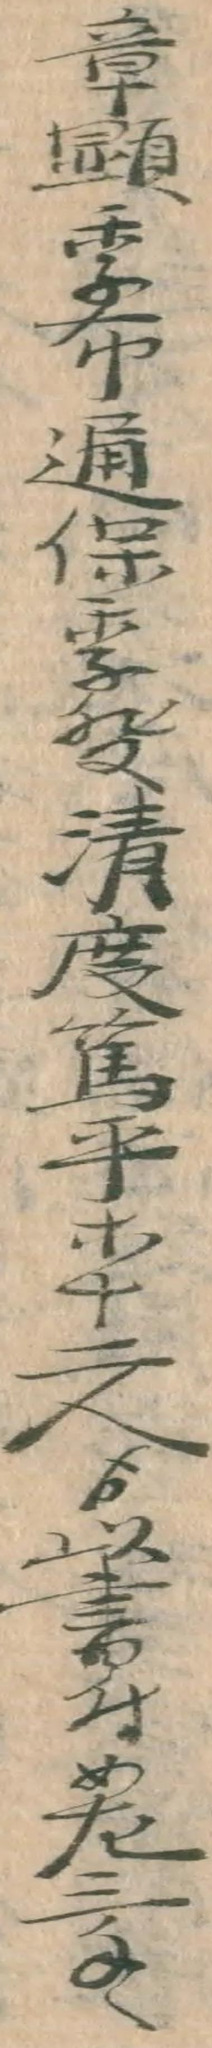章顕季布通保季発清度篤平等十二人ゟ以書付め左三手へ
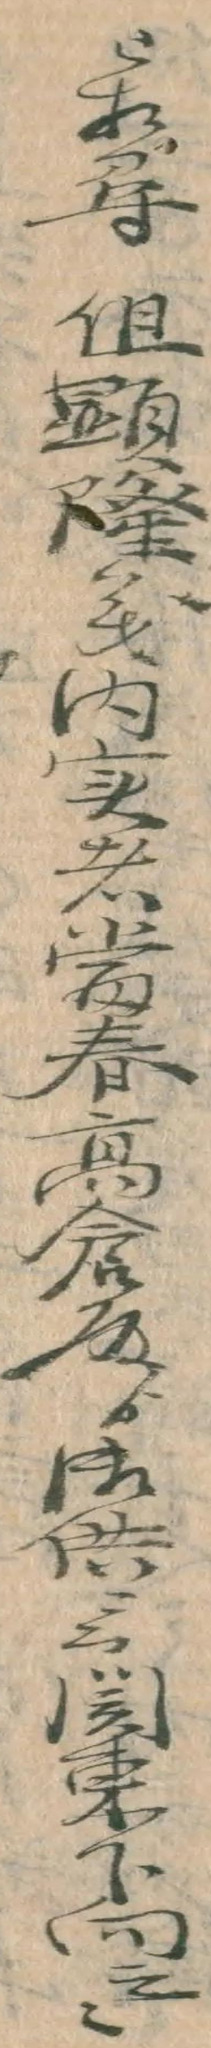被相尋但顕隆義内実者當春高倉殿ゟ御供ニ而関東下向云々
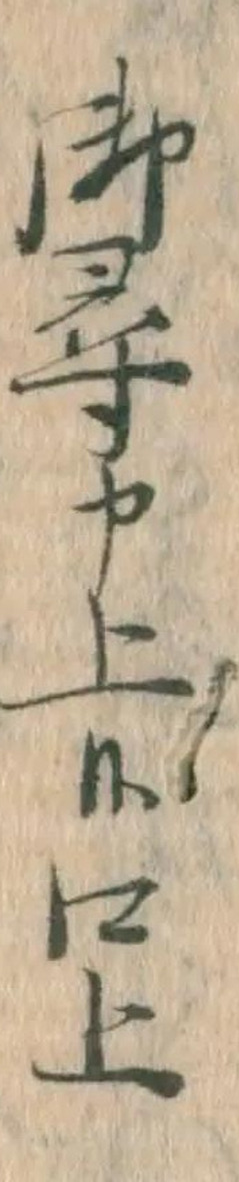御尋申上候口上
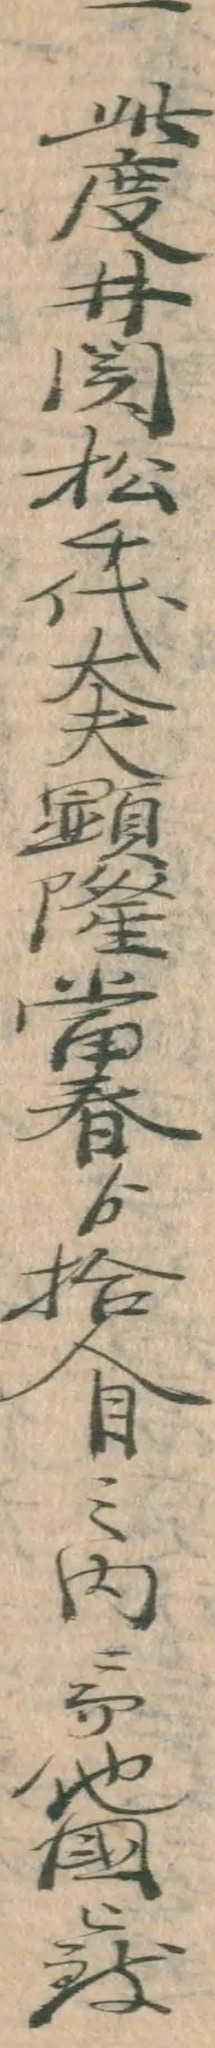一此度井関松千代大夫顕隆當春ゟ拾人目之内ニ而他國被致
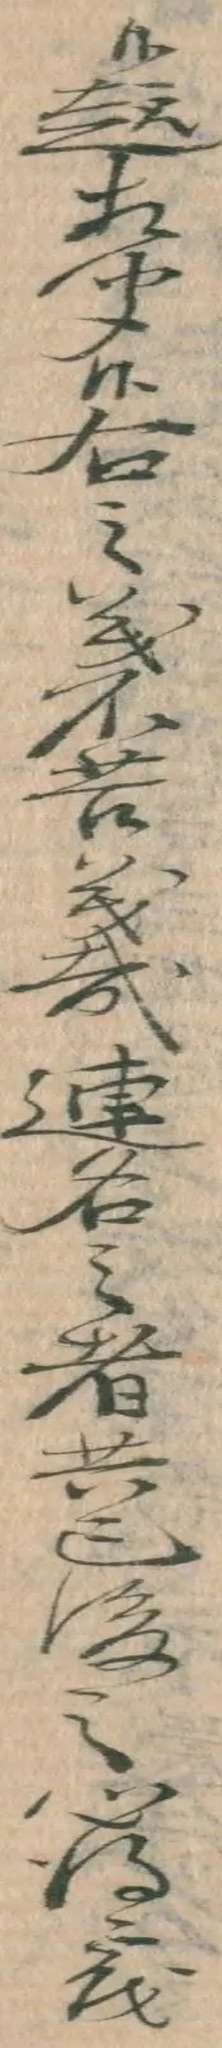候趣相聞候右之義不苦義哉連名之者共已後之心得ニも
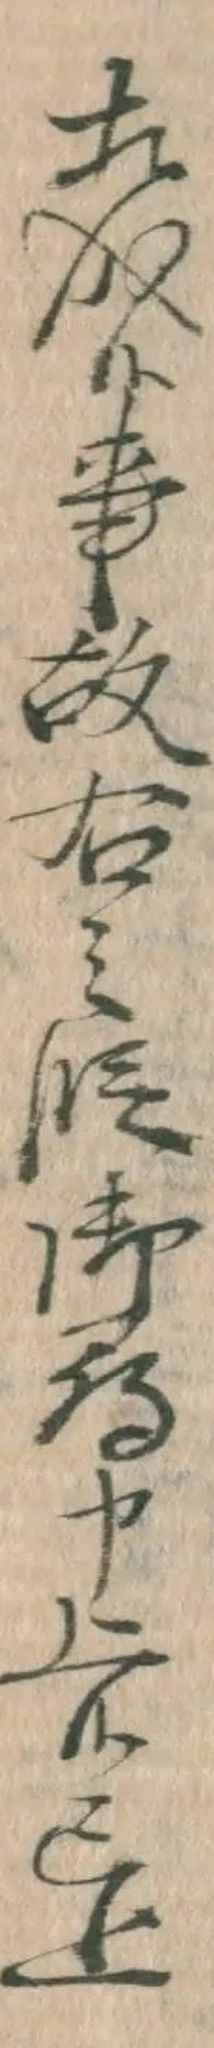相成候事故右之段御尋申上候已上
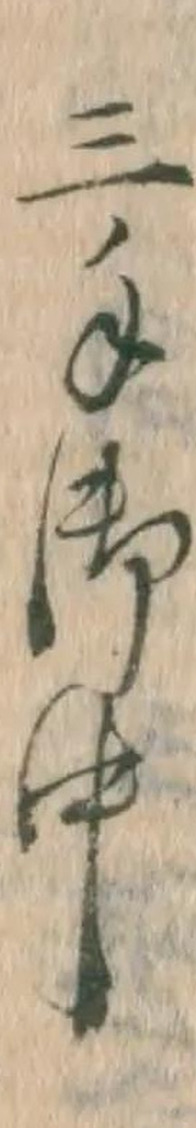三手御中
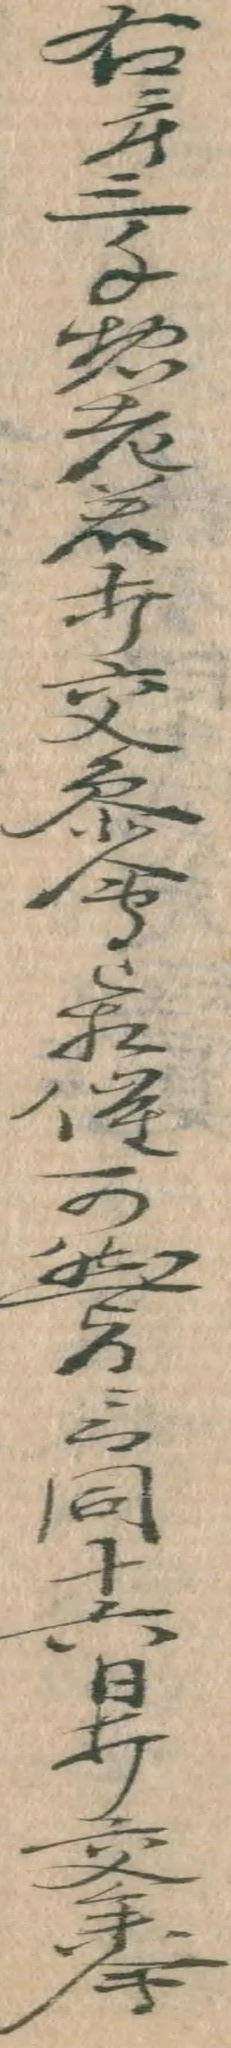右ニ付三手惣老若打交参會被相催可然旨ニ而同十六日打交参會
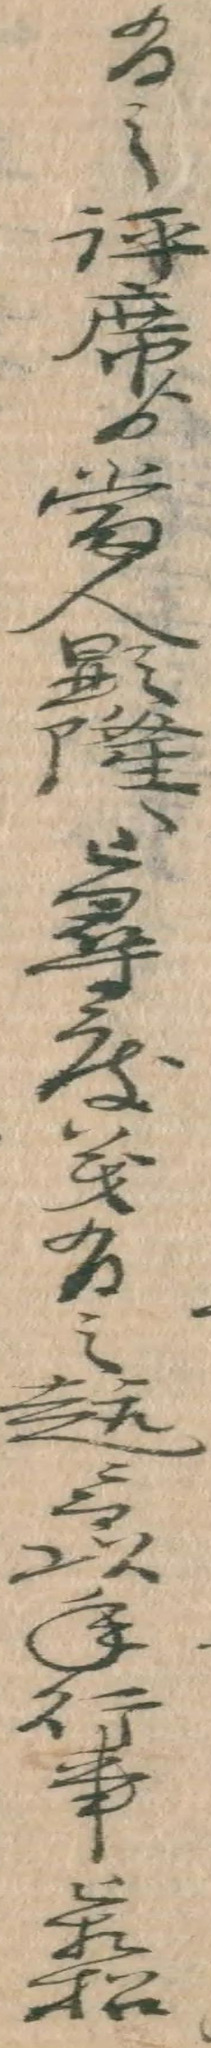有之評席ゟ当人顕隆へ被尋度義有之趣ニ而以手行事被相招
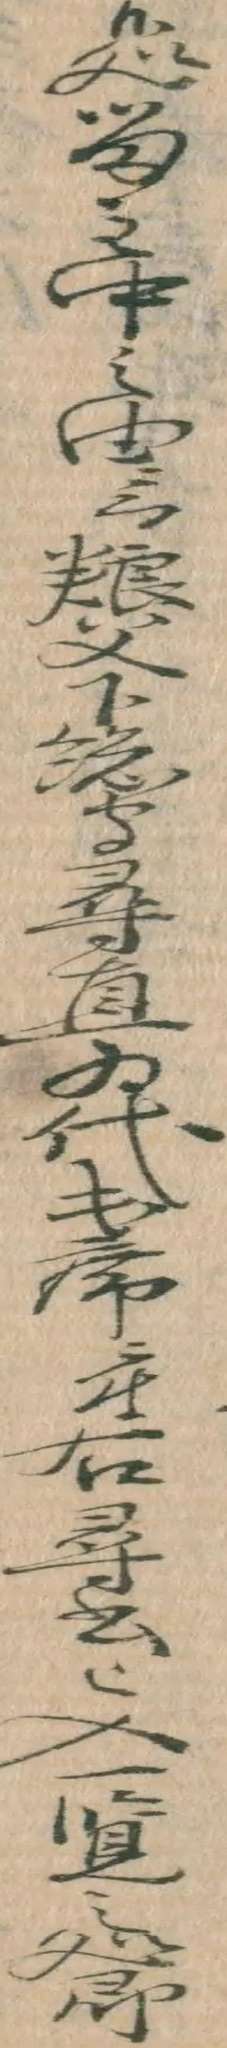候処留主中之由ニ而養父下総守尋直為代出席ニ付右尋書被入一覧之処即
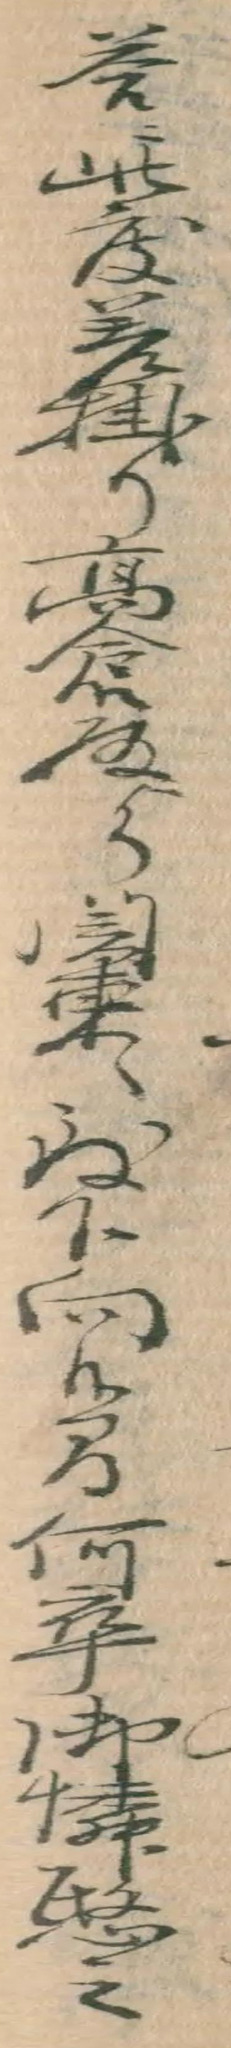答二此度差掛リ高倉殿より関東へ致下向候間何卒御憐愍之
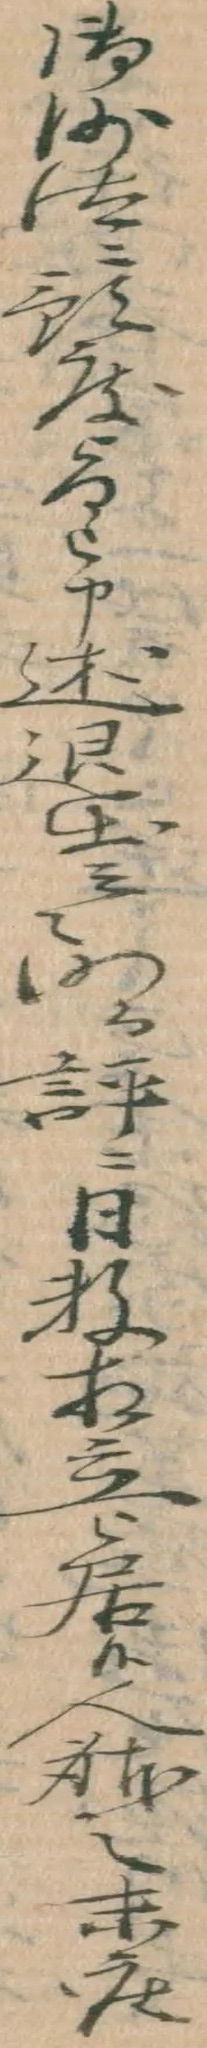御沙汰ニ預度旨被申述退出云々仍而評ニ日数相立被居候人躰之末座
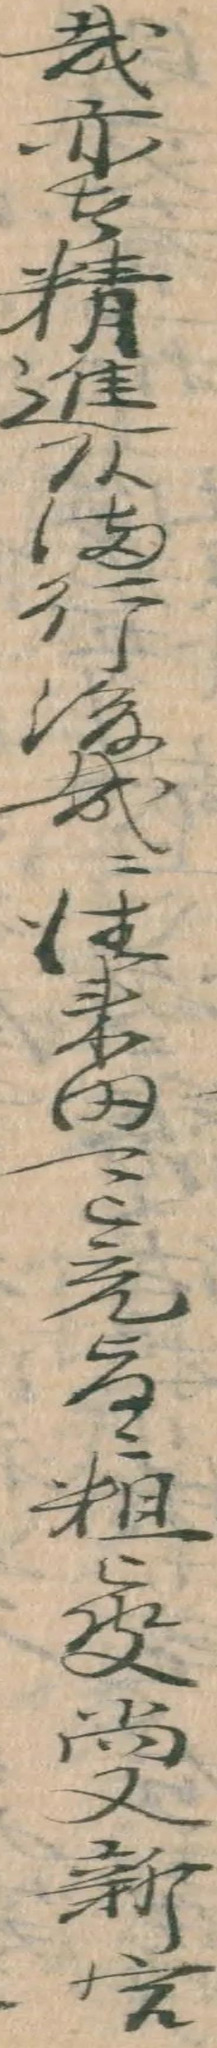哉亦奉精進頭満行後哉ニ往来田可被充旨ニ粗被決尚又新宮
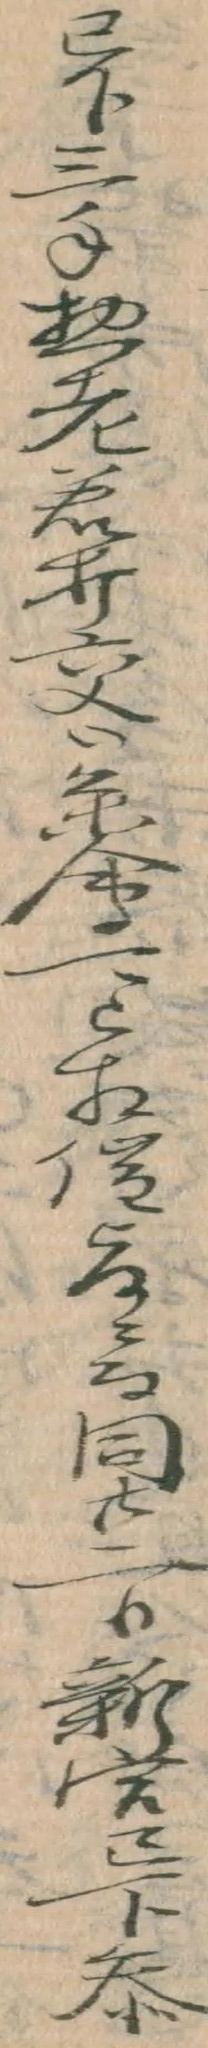已下三手惣老若打交御参會可被相催旨ニ而同廿二日新宮已下参
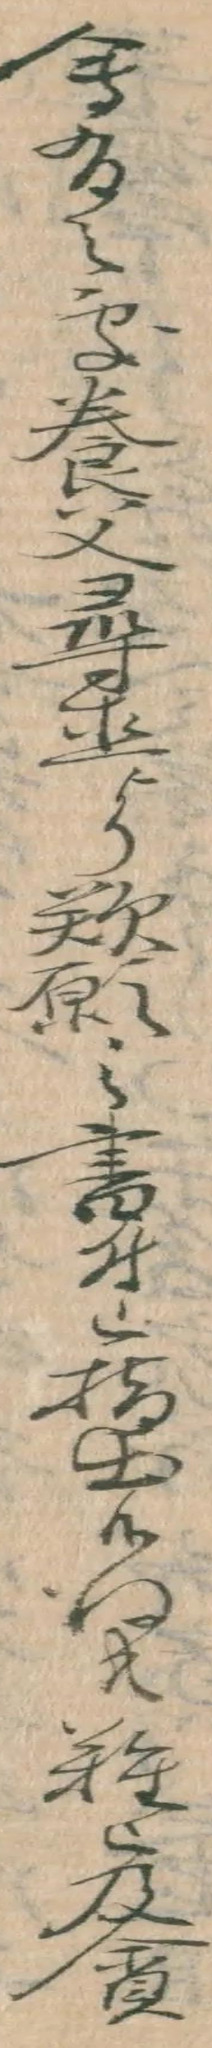會有之處養父尋直より歎願之書付被指出候得共難被及貧
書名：賀茂社記録. 第65冊
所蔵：国立国会図書館 National Diet Library, JAPAN
